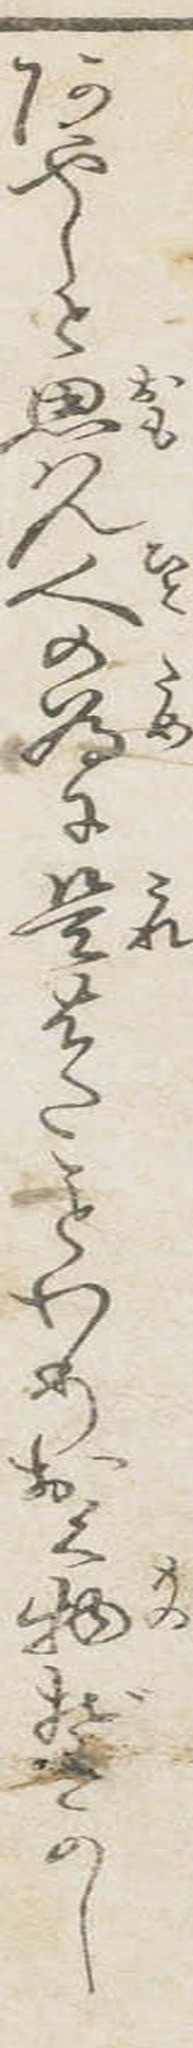あやしと思はん人の為に是はたことわりおく物ぞかし
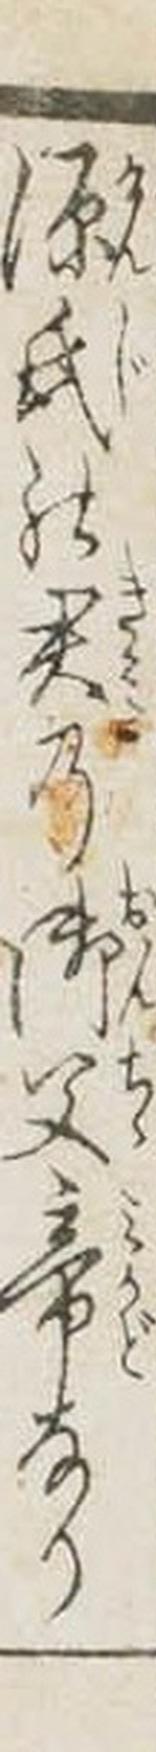源氏の君の御父帝なり
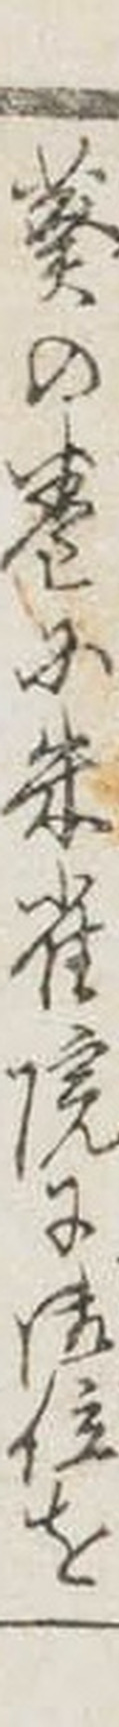葵の巻に朱雀院に御位を
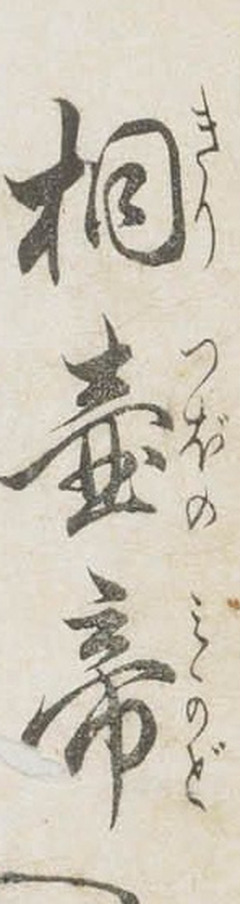桐壺帝
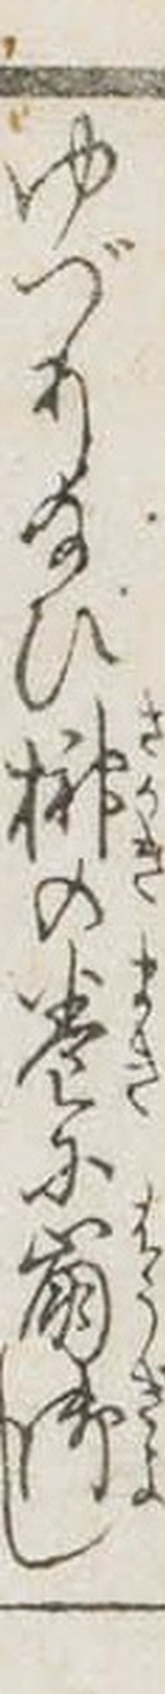ゆづり給ひ榊の巻に崩御し
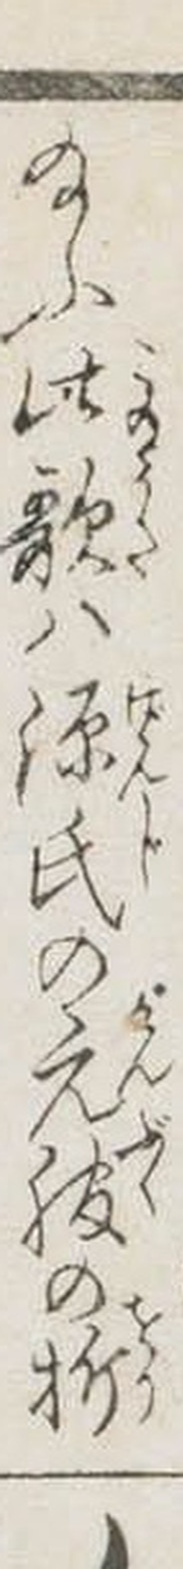給ふ此歌は源氏の元服の折
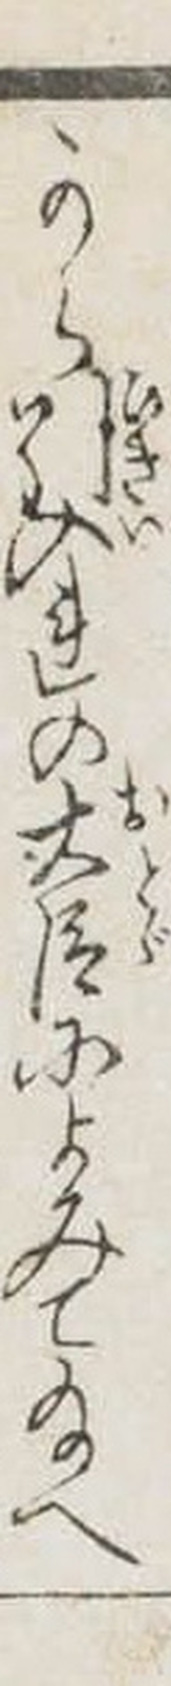から引入れの大臣によみて給へ
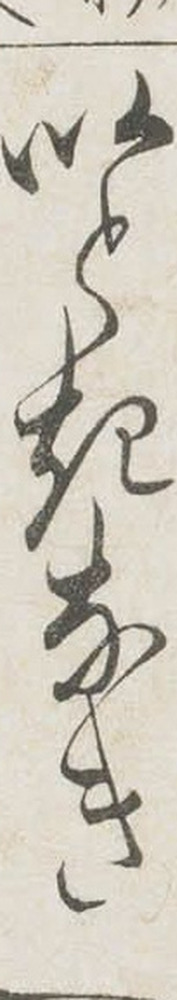いときなき
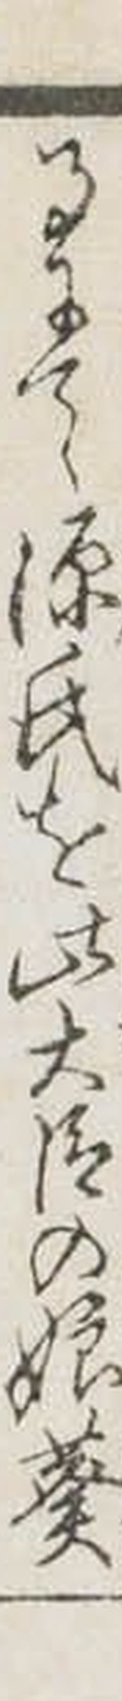るにて源氏を此大臣の娘葵
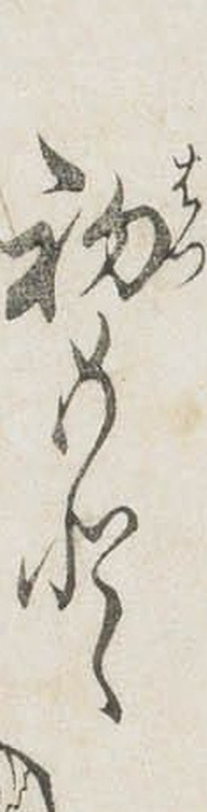初もと
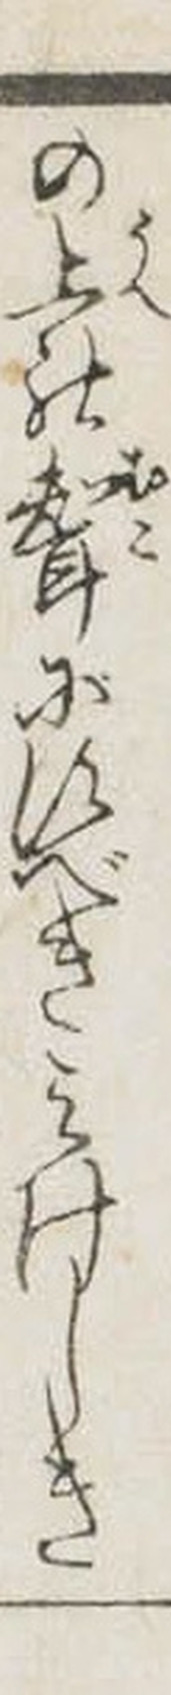の上の聟にすべきみけしき
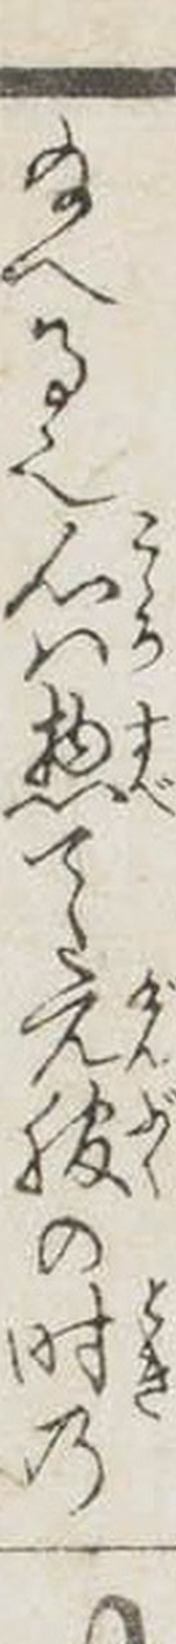給へる也心は総て元服の時の
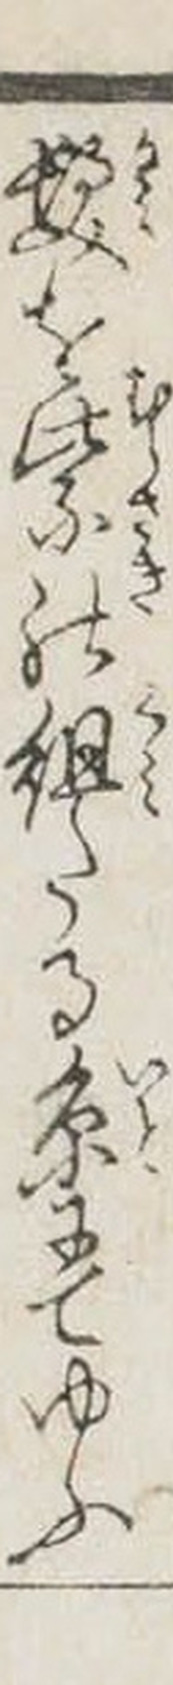髪を紫の組たる糸にてゆふ
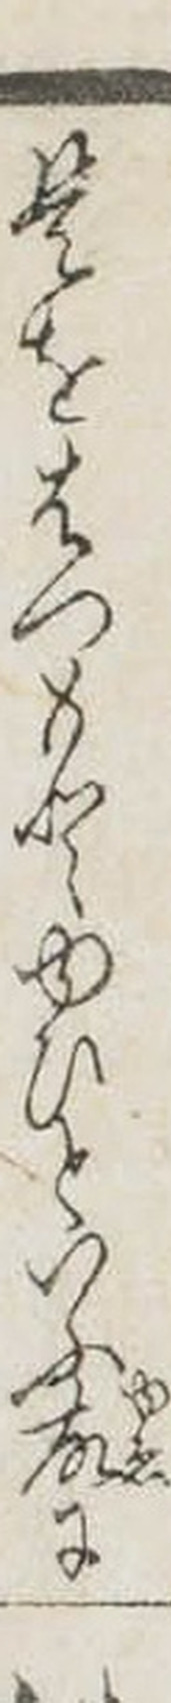是をはつもとゆひといふ故に
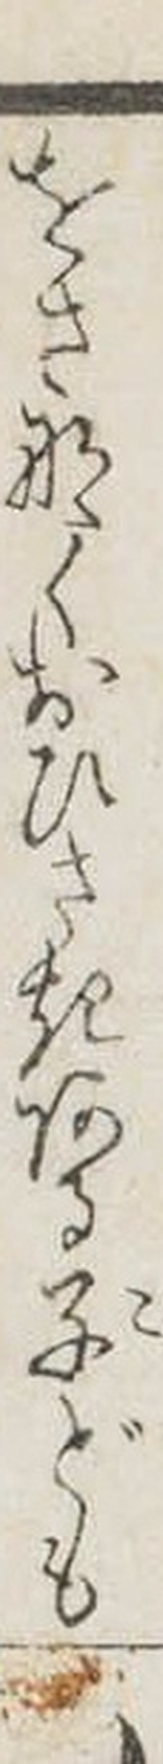をさなくおひさきある子ども
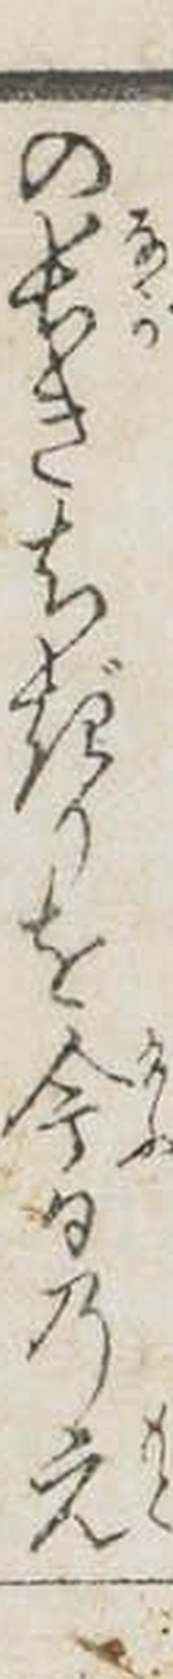の長きちぎりを今日の元
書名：源氏百人一首
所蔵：東京学芸大学教育コンテンツアーカイブ
